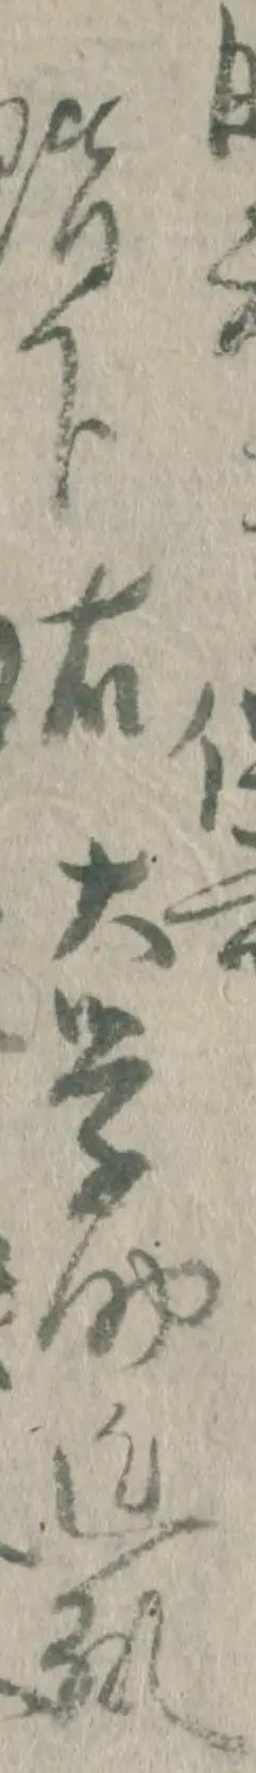階下右大学助近顕

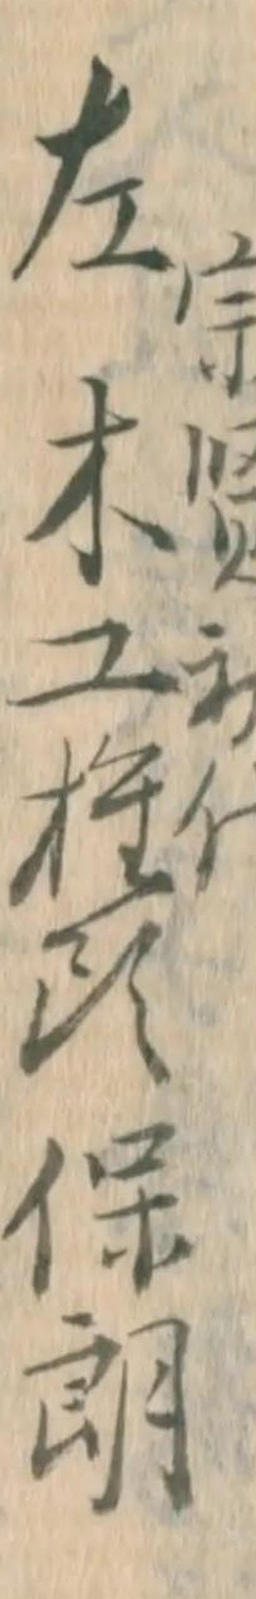左木工権頭保朗
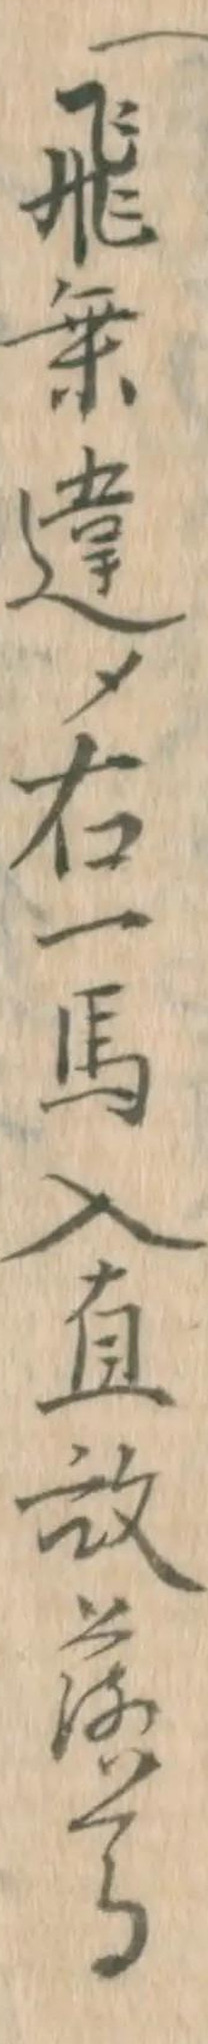(飛乗違シテ右一馬入直故落馬
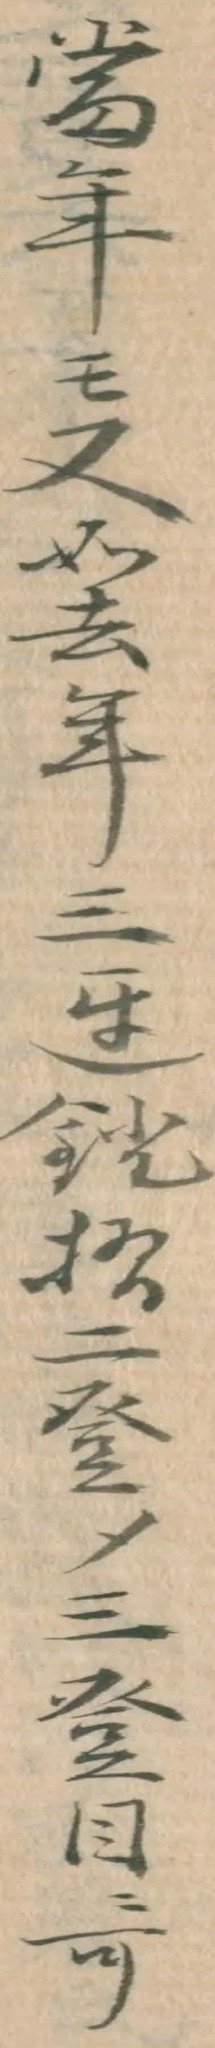当年モ又如去年三遅鎧摺二登シテ三登目ニ可
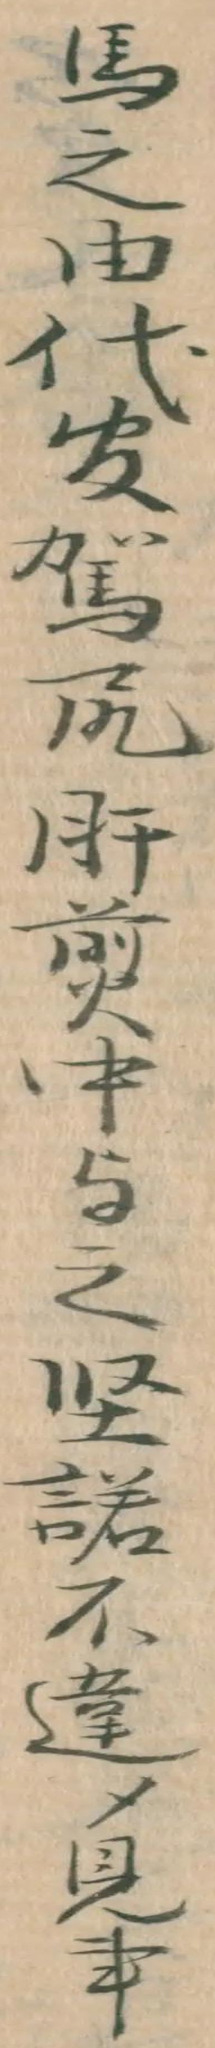馬之由代官駕尻肝煎中与之堅諾不違シテ見事
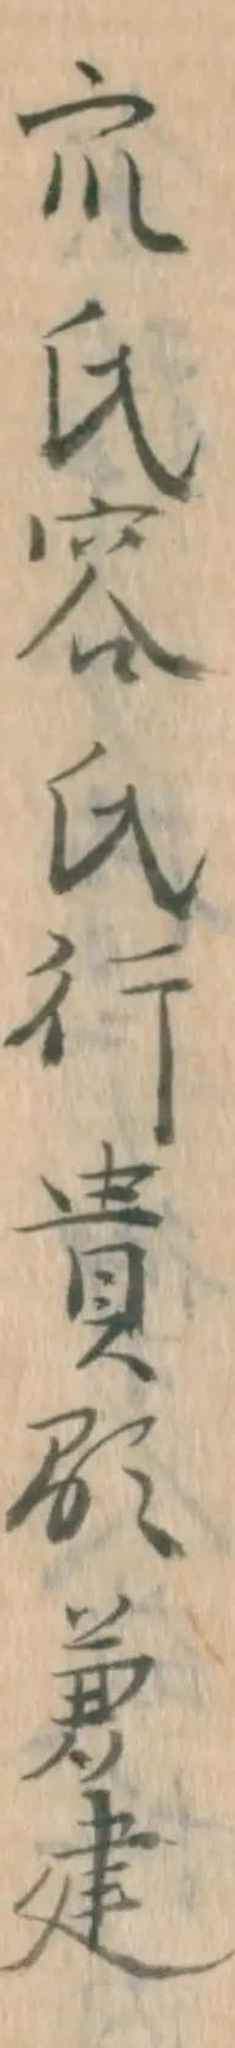衆氏容氏行貴顕兼建
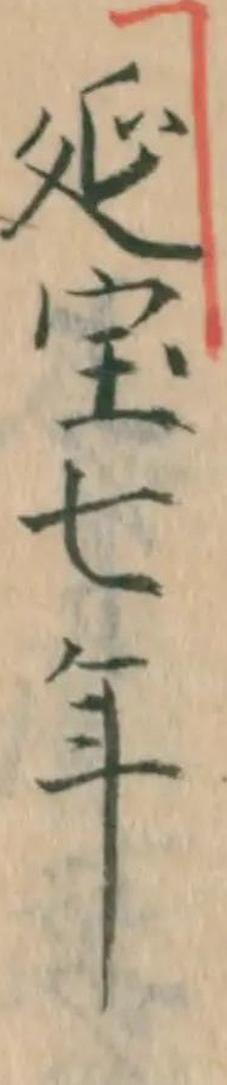延宝七年
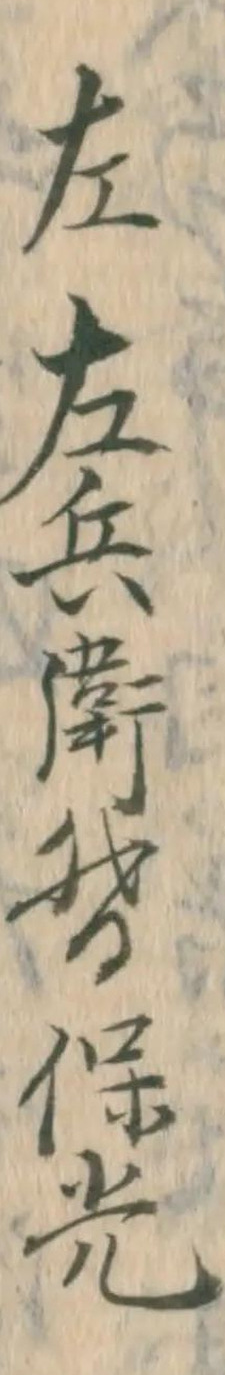左左兵衛督保光
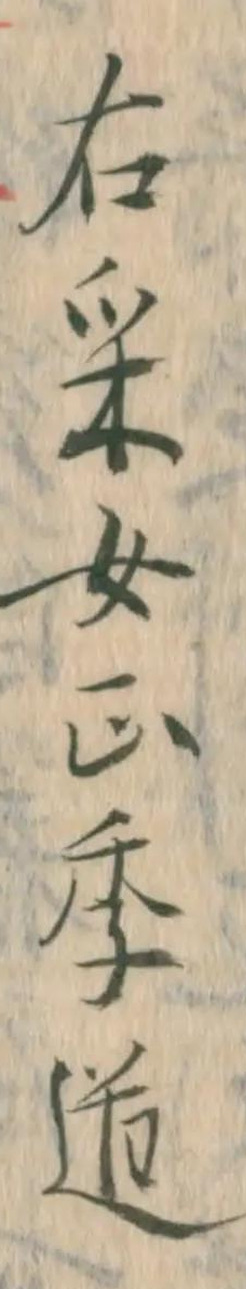右采女正季道
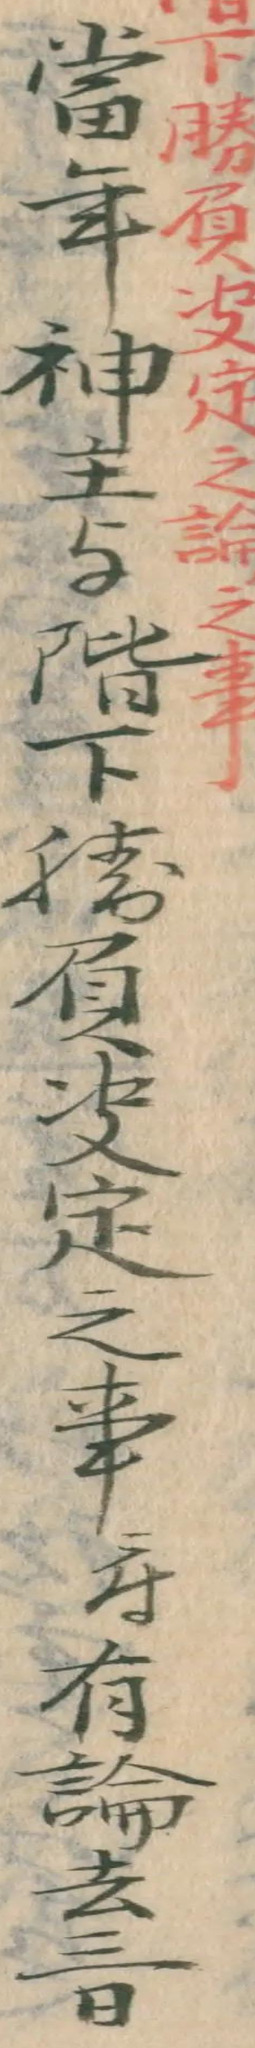当年神主与階下勝負決定之事ニ付有論去三日
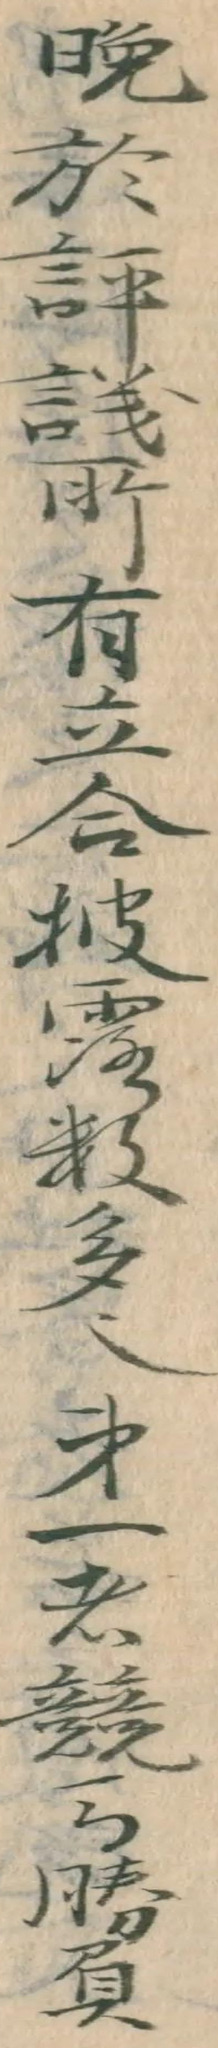晩於評議所有立合披露数多也第一者競馬勝負
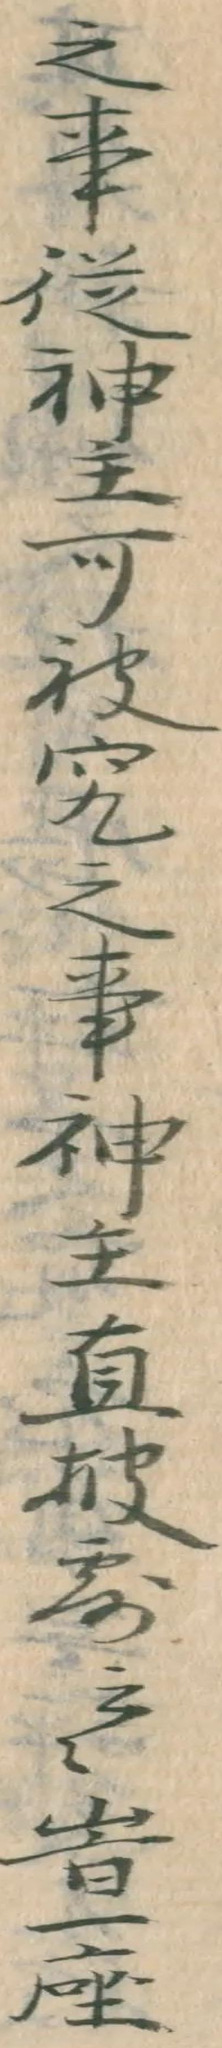之事従神主可被究之事神主直披露云々旹一座
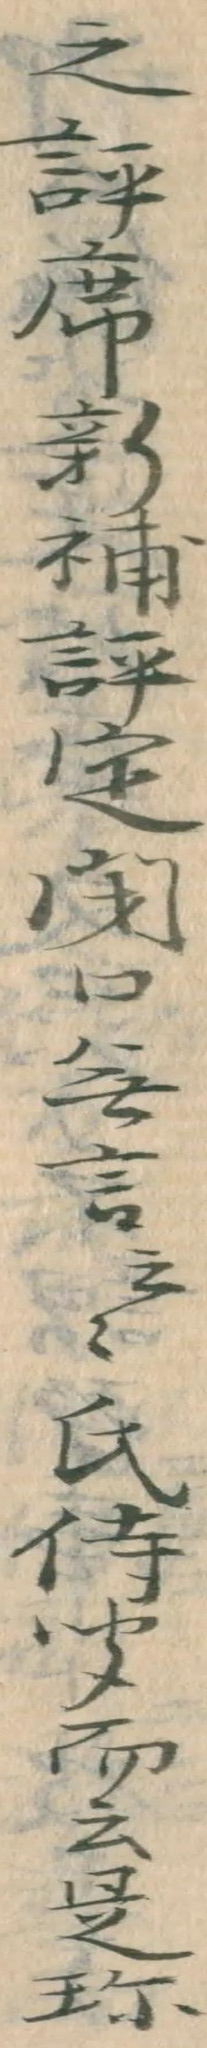之評席新補評定閉口無言云々氏侍聞而云是珍
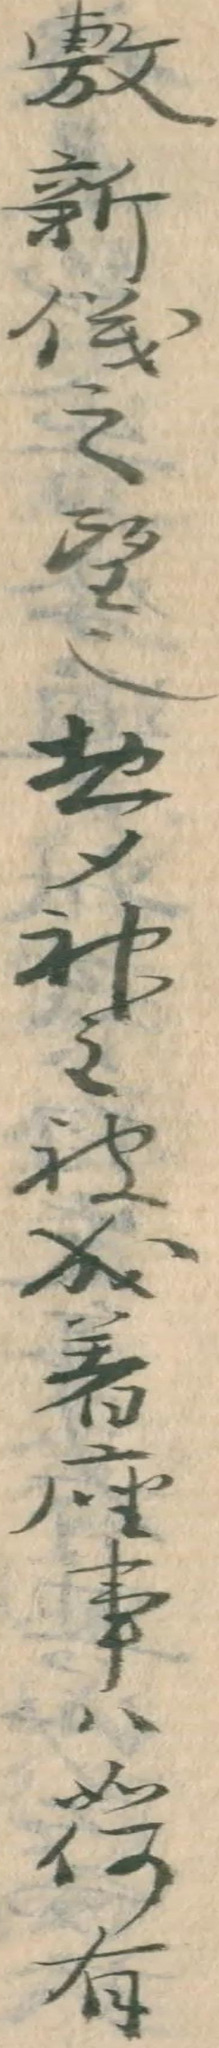敷新儀之望也惣シテ神主被成着座事ハ如何有
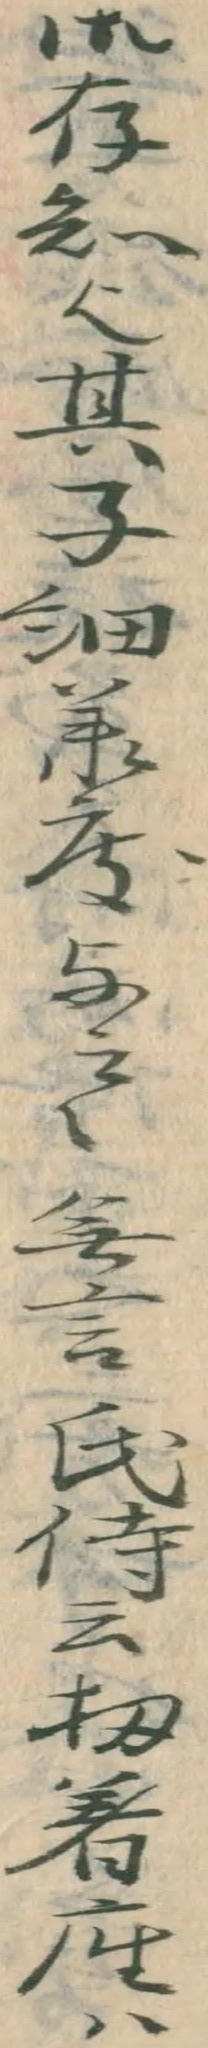御存知也其子細承度与云々無言氏侍云扨着座ハ
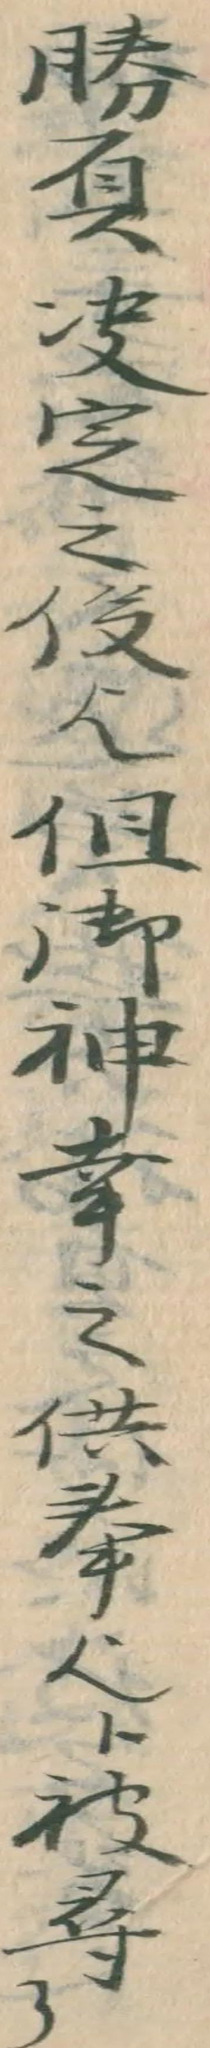勝負決定之使也但御神幸之供奉也ト被尋了
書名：賀茂社記録. 第10冊
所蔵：国立国会図書館 National Diet Library, JAPAN
